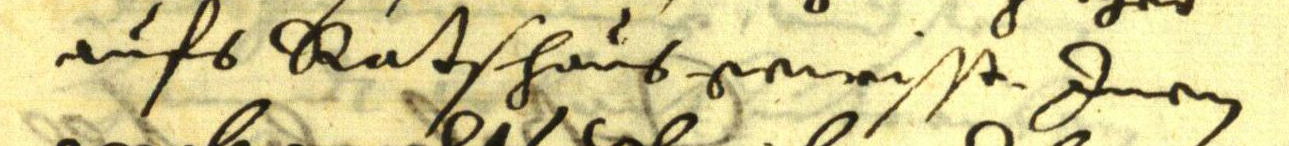aūfs Ratshaūs gewisst. Inen
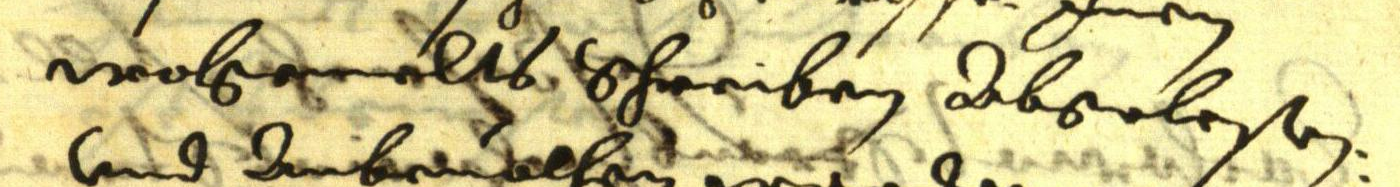wolgemelts Schreiben Abgelesen¬
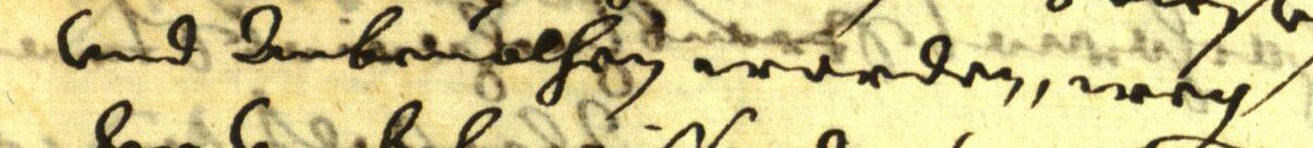vnd Ainbeūolhen worden, weg
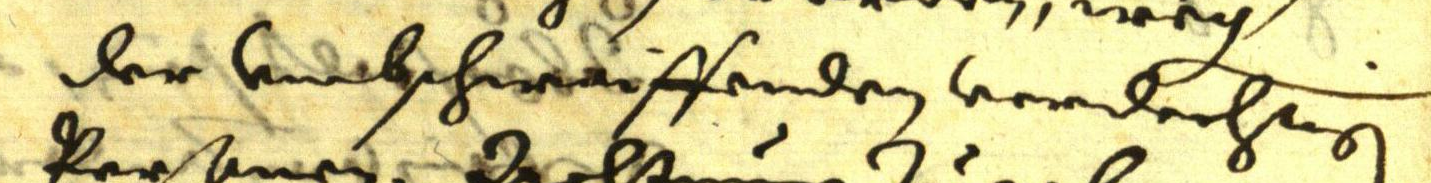der vmbschwaiffenden verdechtig
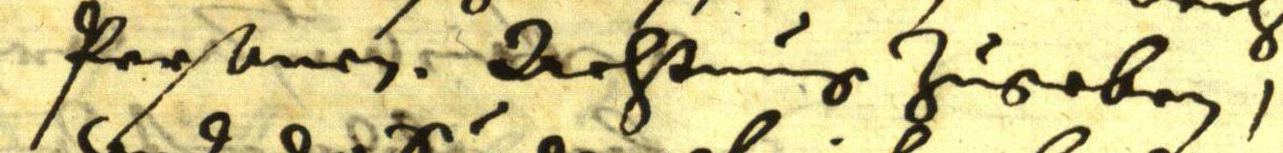Personen. Achtūng Zūgeb,
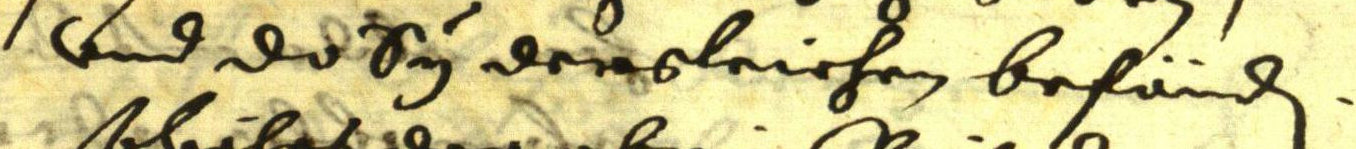vnd da Sȳ dergleichen befänd.
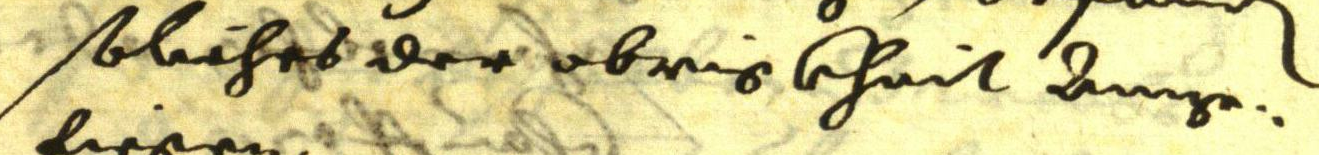soliches der obrigkhait Anze¬
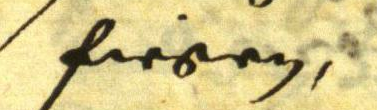fiegen,
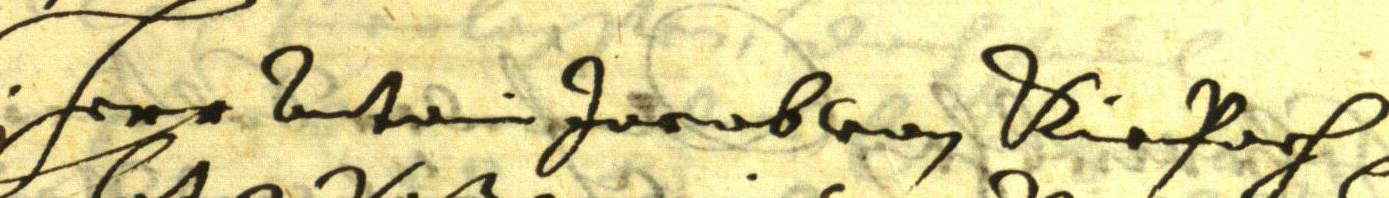herr Antoni Jacob von KiePach etc
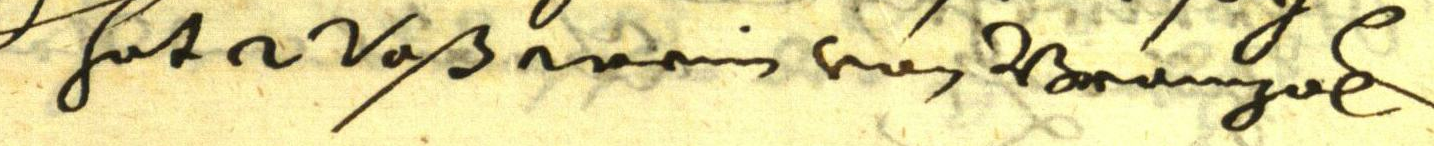hat 2 Vaß wein von Branzol
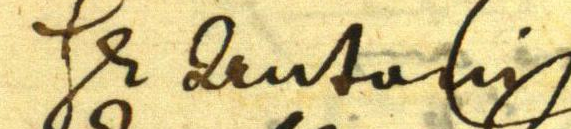hl Antoni
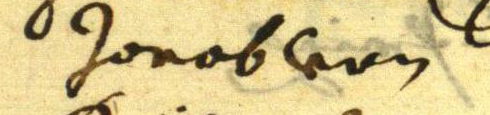Jacob von
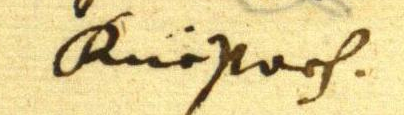KüePach.
